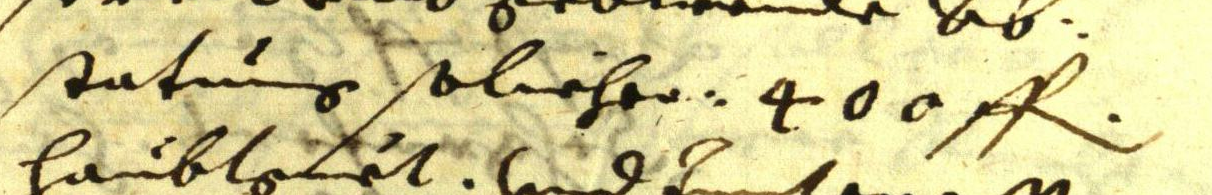statūng solicher 400 fl
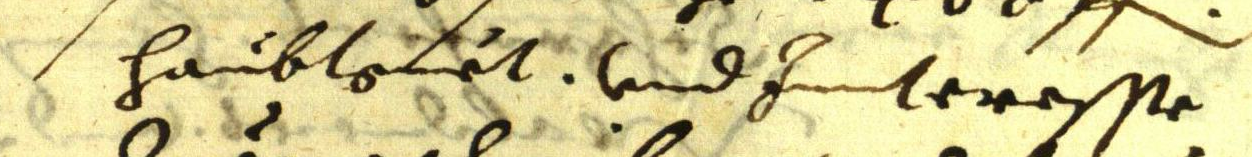haūbtgūet vnd Innteresse
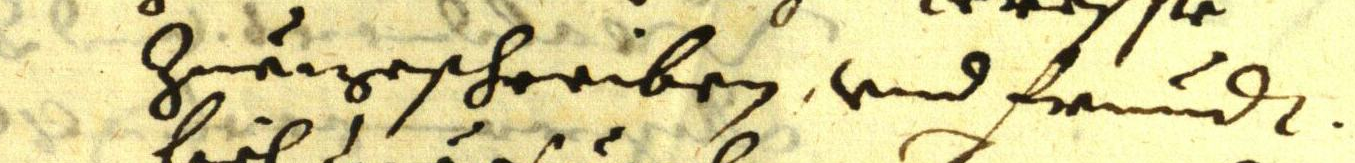zūetzeschreiben vnd frūndt¬
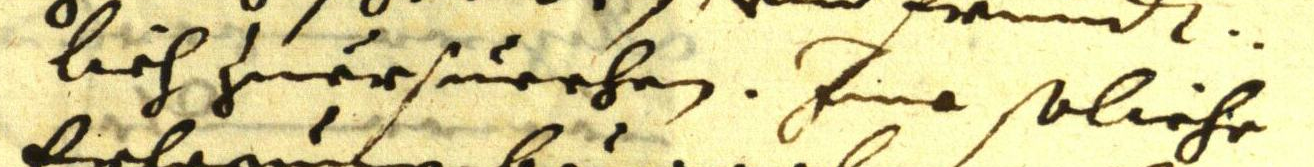lich Zūersūechen Ime soliche
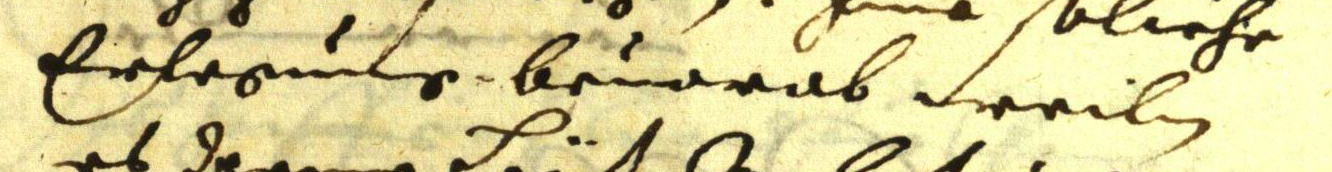Erlegūng bevorab Weiln
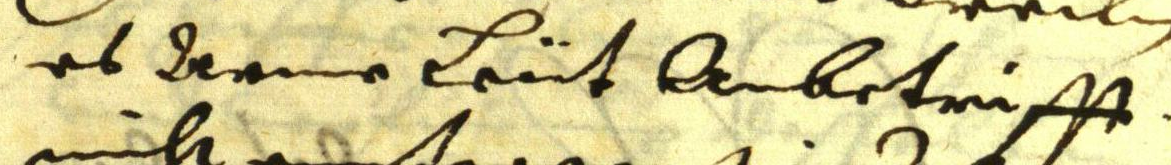Es Arme Leüt Anbetrifft
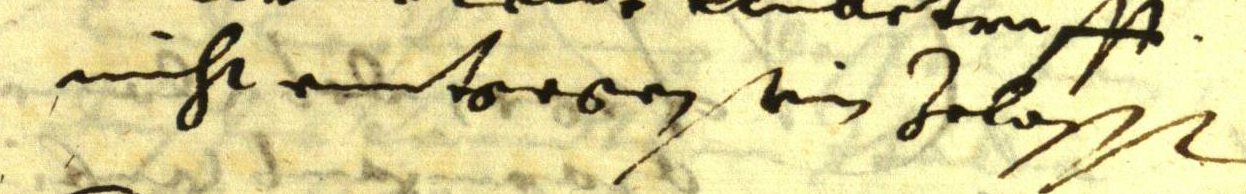nicht enntgegen sein Zelassen.
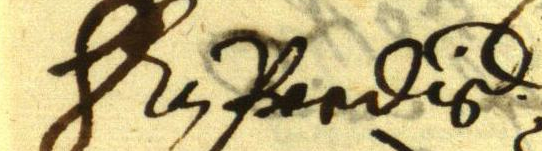H Predig
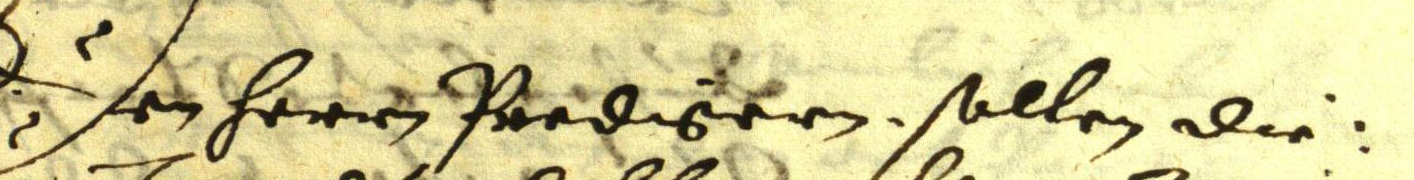Den herrn Predigern sollen die
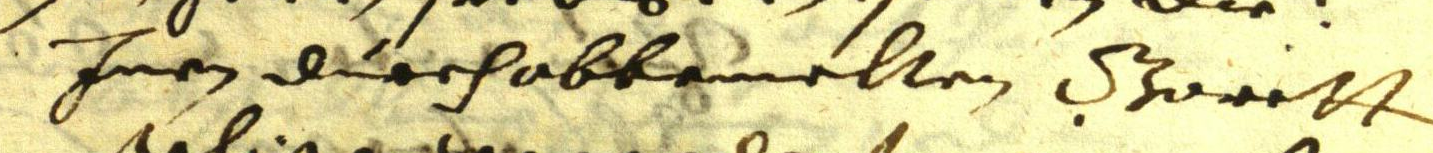Inen dūrch obbemelten Gorett
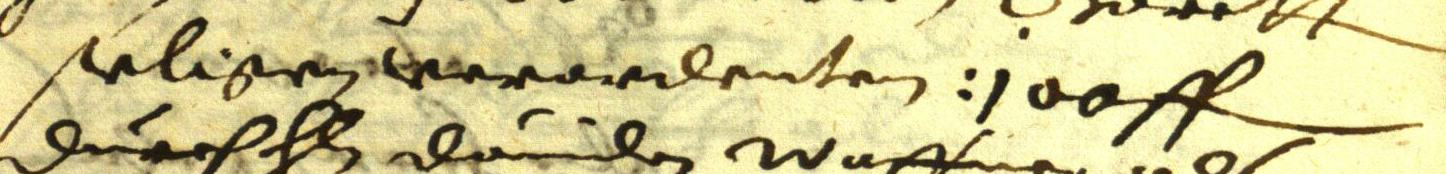Seligen verordenten 100 fl
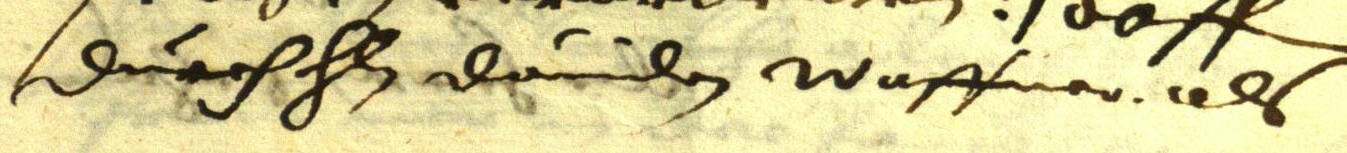Dūrch h Davidn Waffner als
